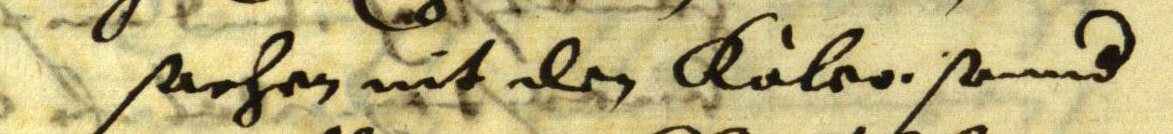Sachen nit den Kōler. sonnd
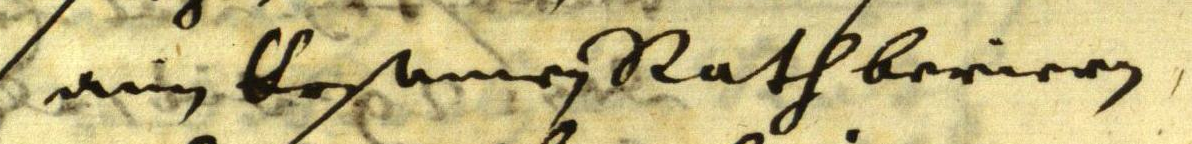Aim Ersamen Rath beriern
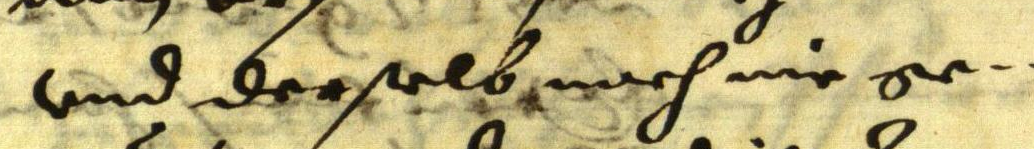vnd derselb noch nie ge¬
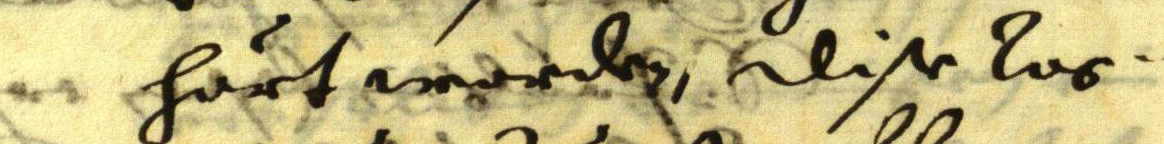hōrt worden, dise Tag¬
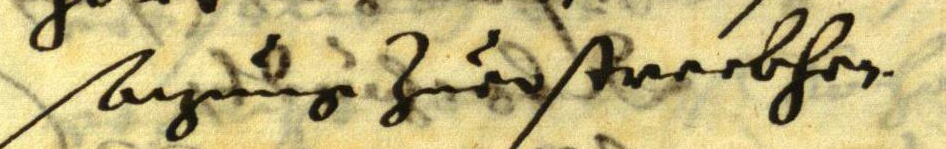sazūng Zūerstreckhen.
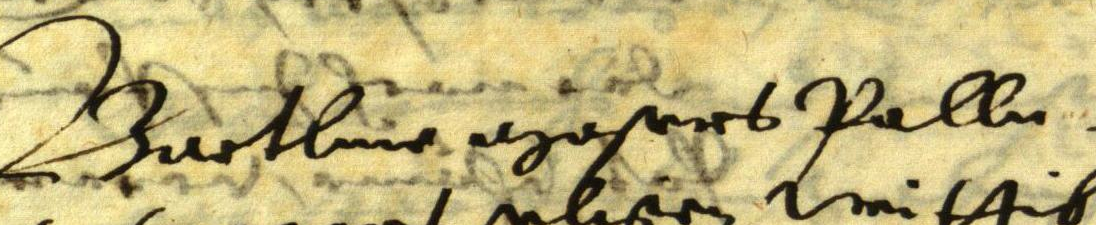Bartlme Mosers Palln¬
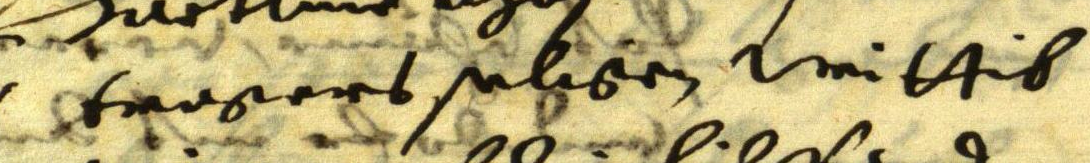tragers seligen Wittib
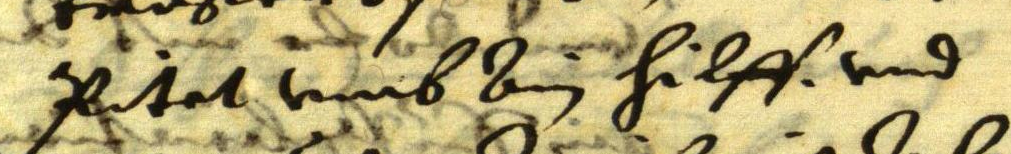Pitet vmb Ain hilff. vnd
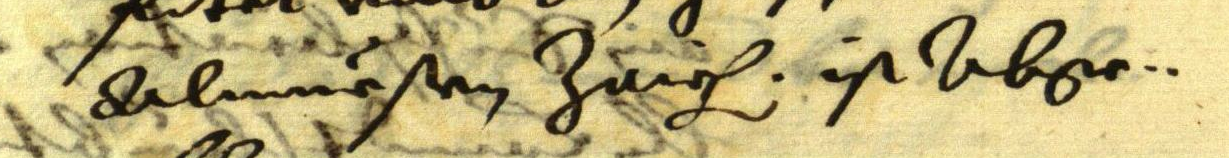Almūesen Zaich. ist Abge¬
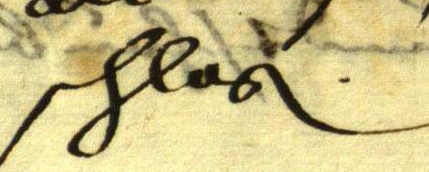schlag.
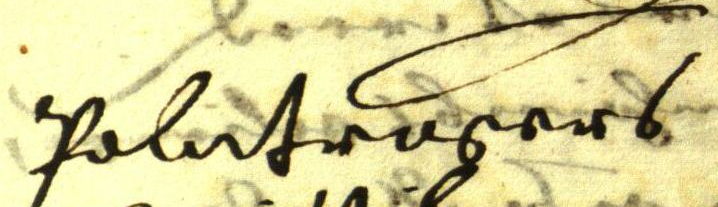Palntragers
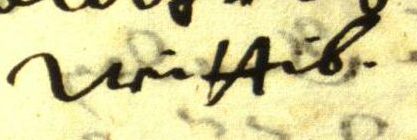Wittib.
